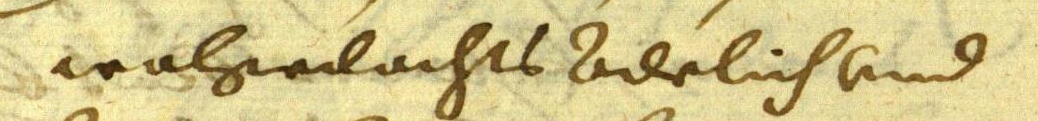wolgedachts Adelich vnd
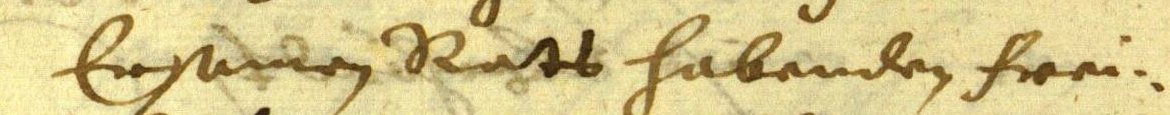Ersamen Rats habenden frei¬
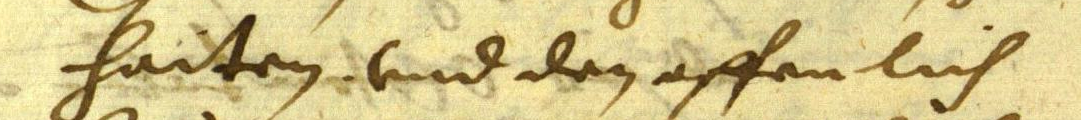haiten. vnd den offen lich
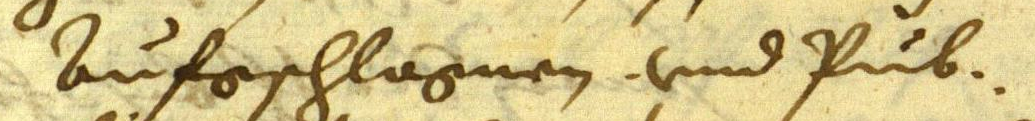Aūfgschlagnen. vnd Pūb¬
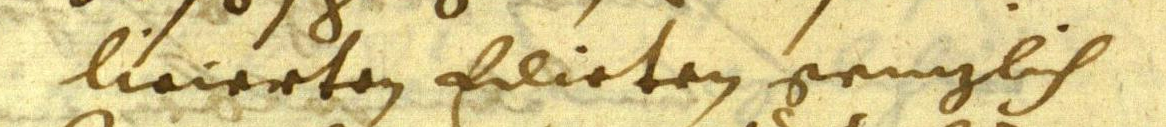licierten Edicten gennzlich
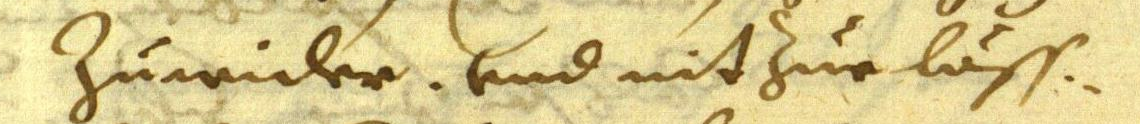Zūwider. vnd nit Zūe lāss¬
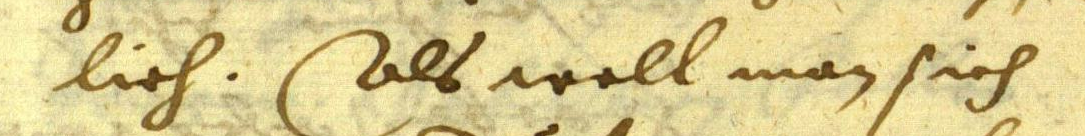lich. Als well man sich
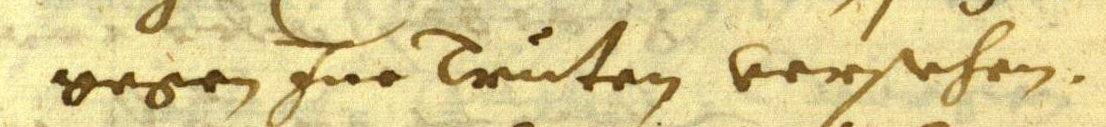gegen Ine Trūten versehen.
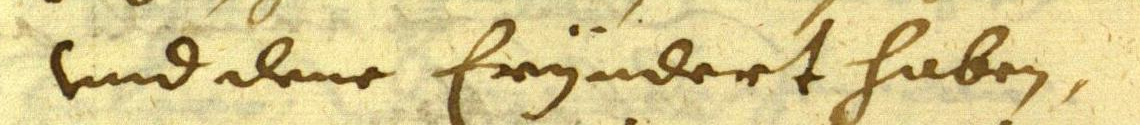vnd dene Erÿndert haben,
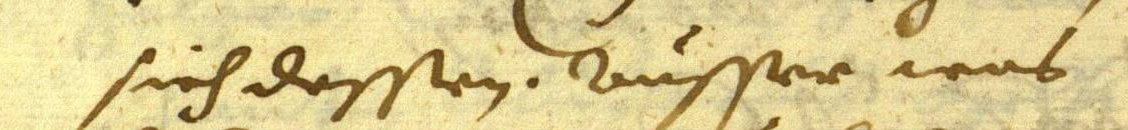sich dessen. Aūsser was
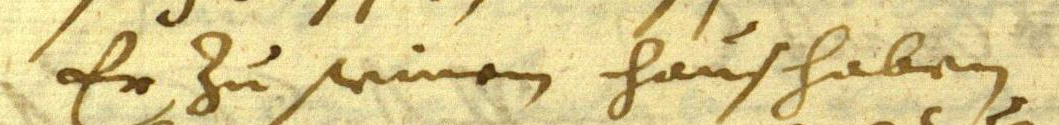Er Zū seinem haūshaben
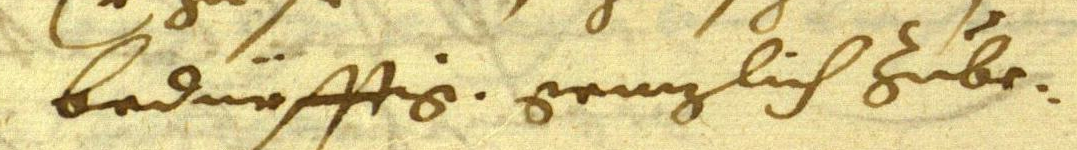bedürfftig. gennzlich Zūbe¬
